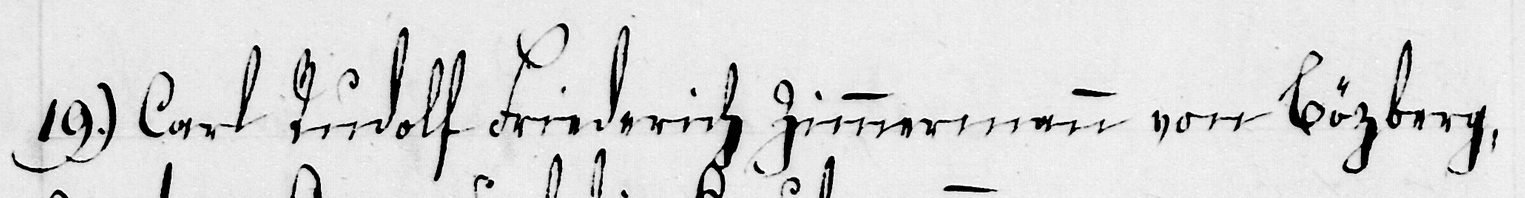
19.) Carl Rudolf Friederich Zimmermann von Bözberg,
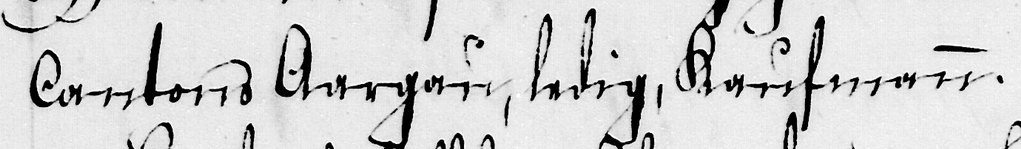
Cantons Aargau, ledig, Kaufmann.
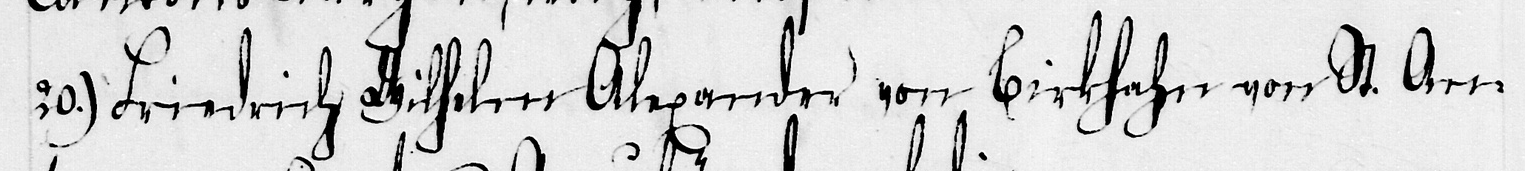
20.) Friedrich Wilhelm Alexander von Birkhahn von St. An¬
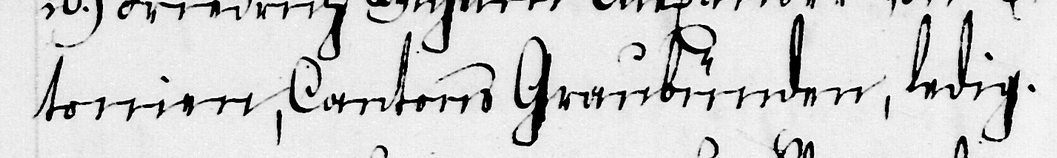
tonien, Cantons Graubünden, ledig.
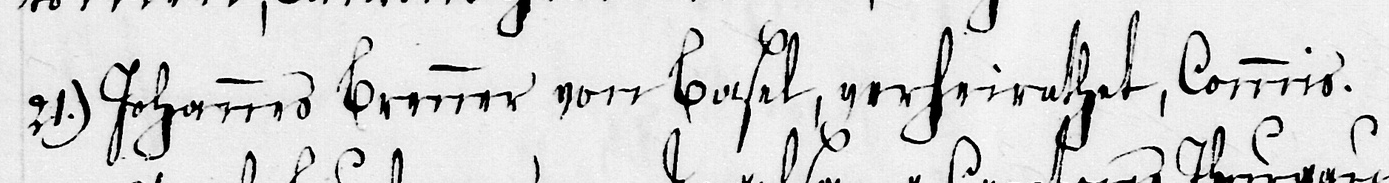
21.) Johannes Brenner von Basel, verheirathet, Commis.
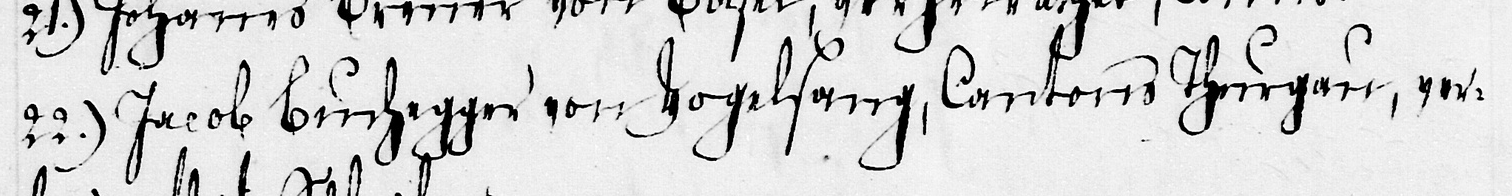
22.) Jacob Buchegger von Vogelsang, Cantons Thurgau, ver¬
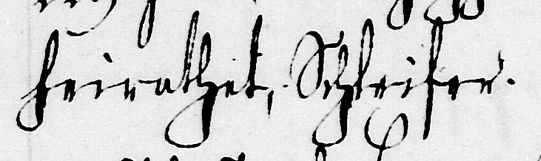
heirathet, Schleifer.
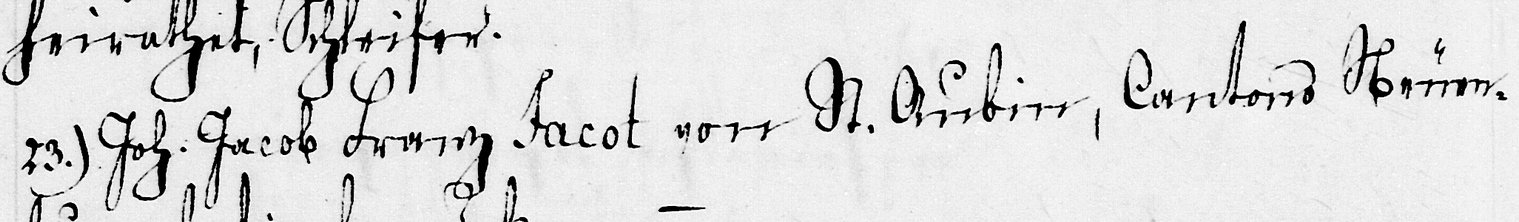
23.) Joh. Jacob Franz Jacot von St. Aubin, Cantons Neuen¬
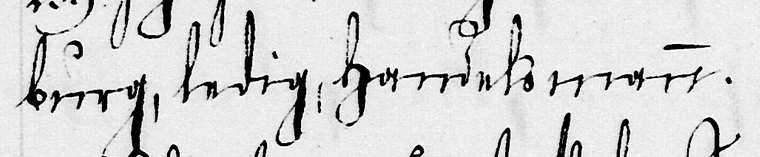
burg, ledig, Handelsmann.
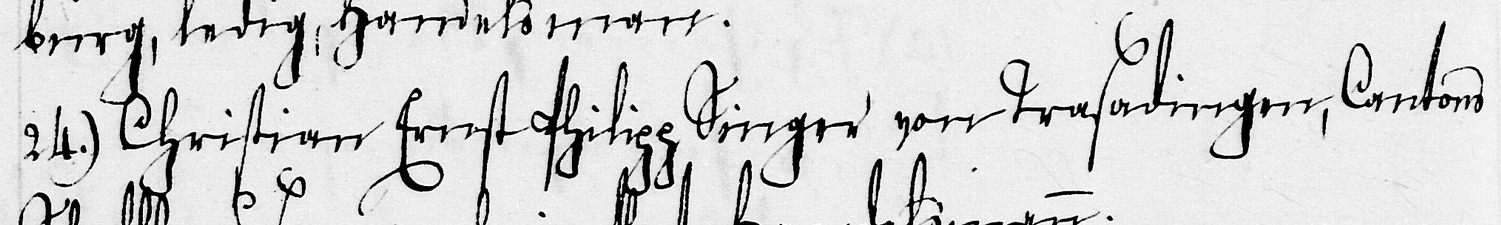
24.) Christian Ernst Philipp Singer von Trasadingen, Cantons
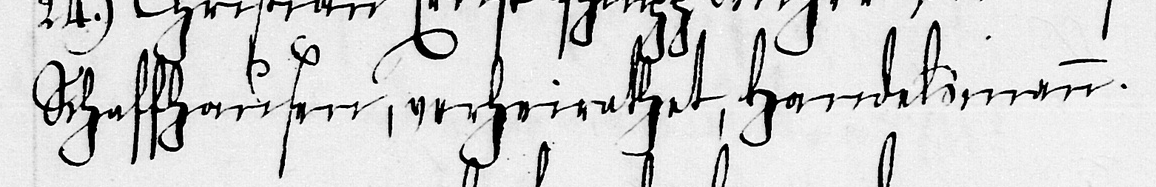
Schaffhausen, verheirathet, Handelsmann.
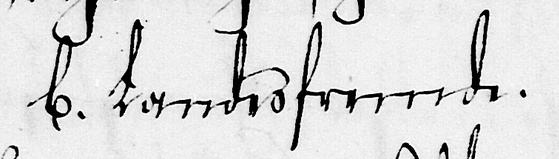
b. Landesfremde.
